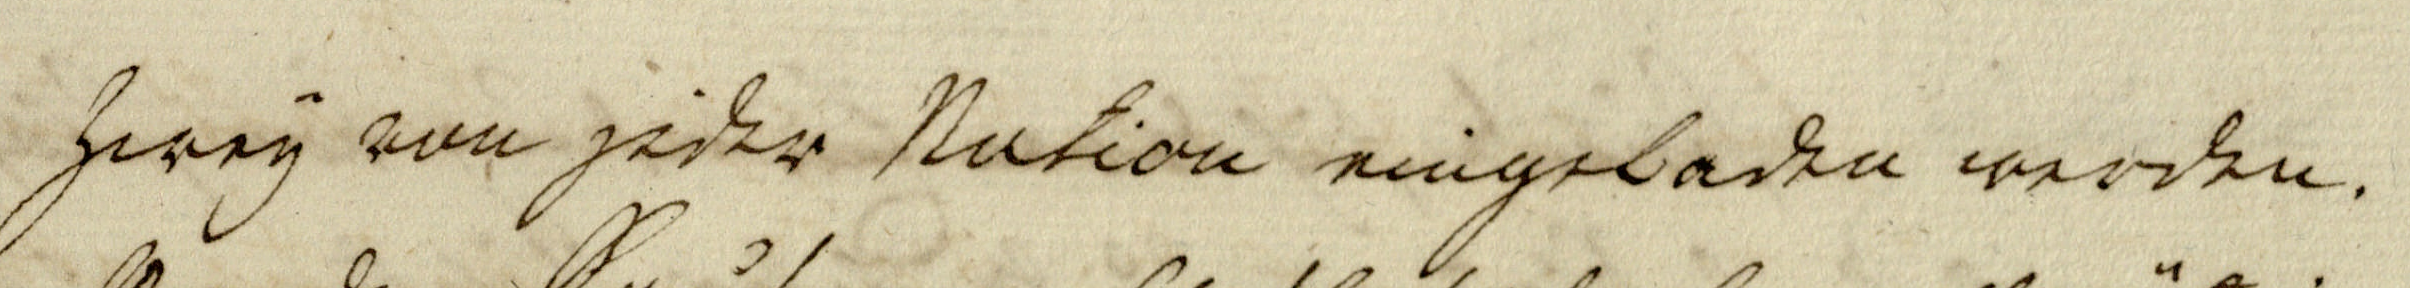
zweÿ von jeder Nation eingeladen werden.
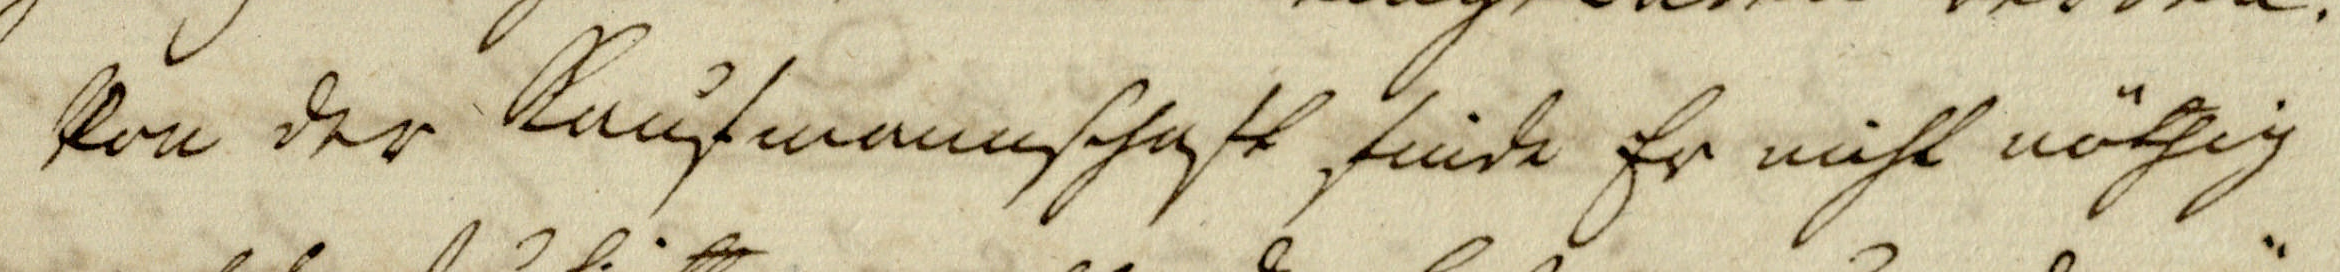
Von der Kaufmannschaft finde Er nicht nöthig
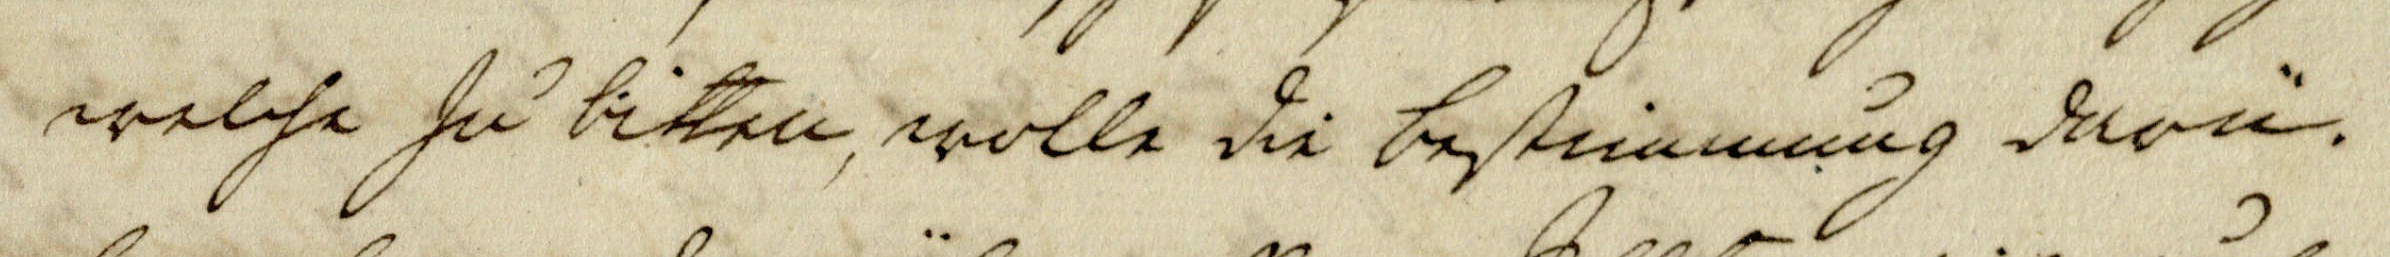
welche zu bitten, wolle die Bestimmung darü¬
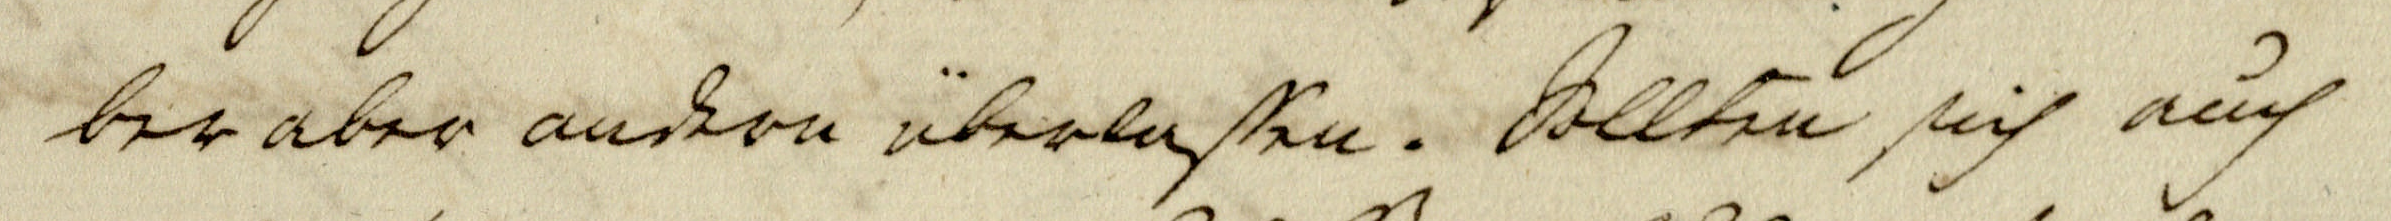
ber aber andern überlassen. Sollten sich auch
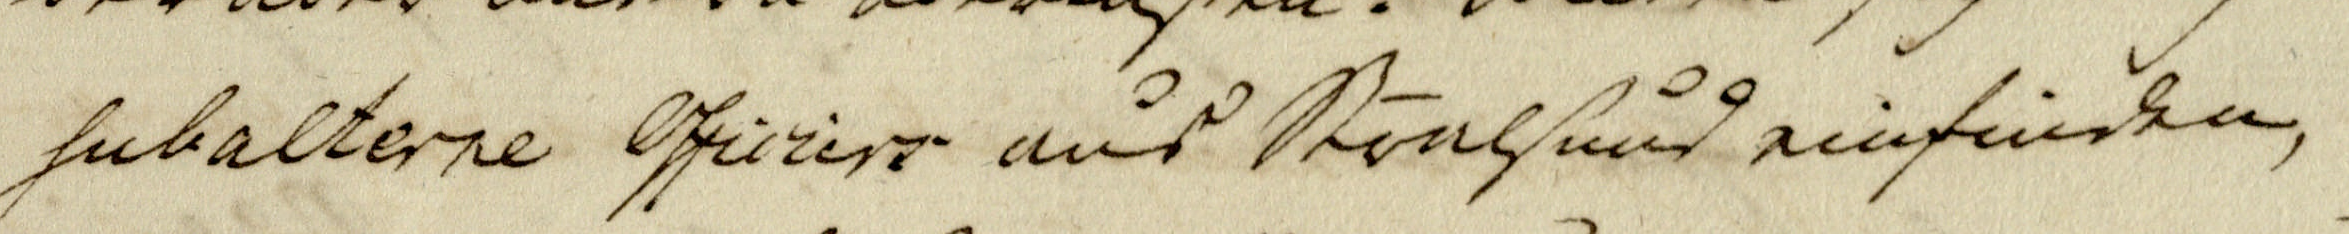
subalterne Officiers aus Stralsund einfinden,
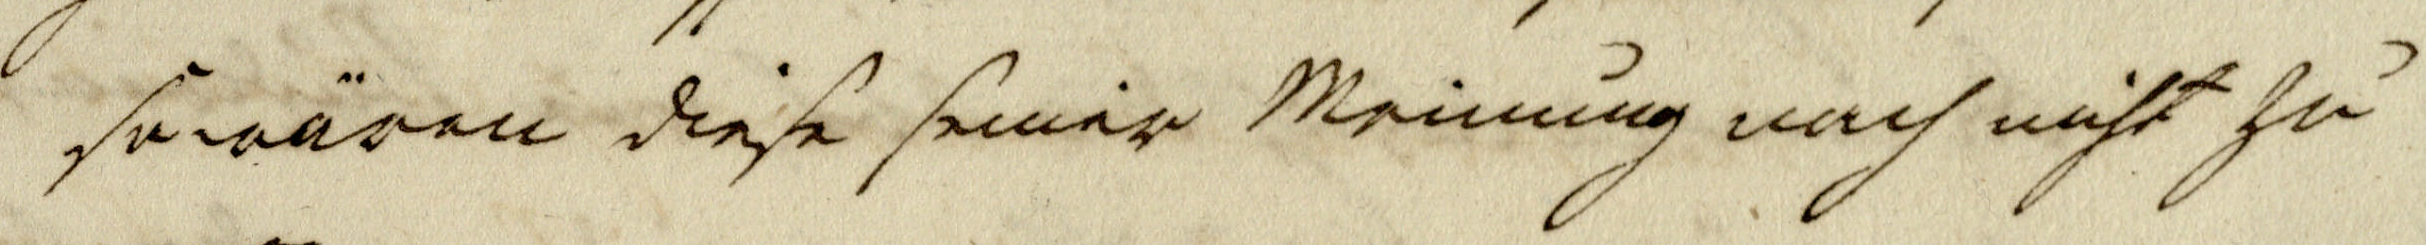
so wären diese seiner Meinung nach nicht zu
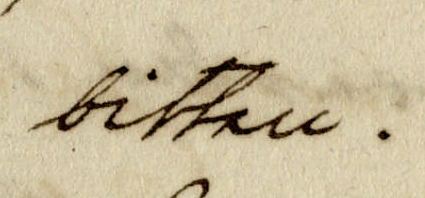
bitten.
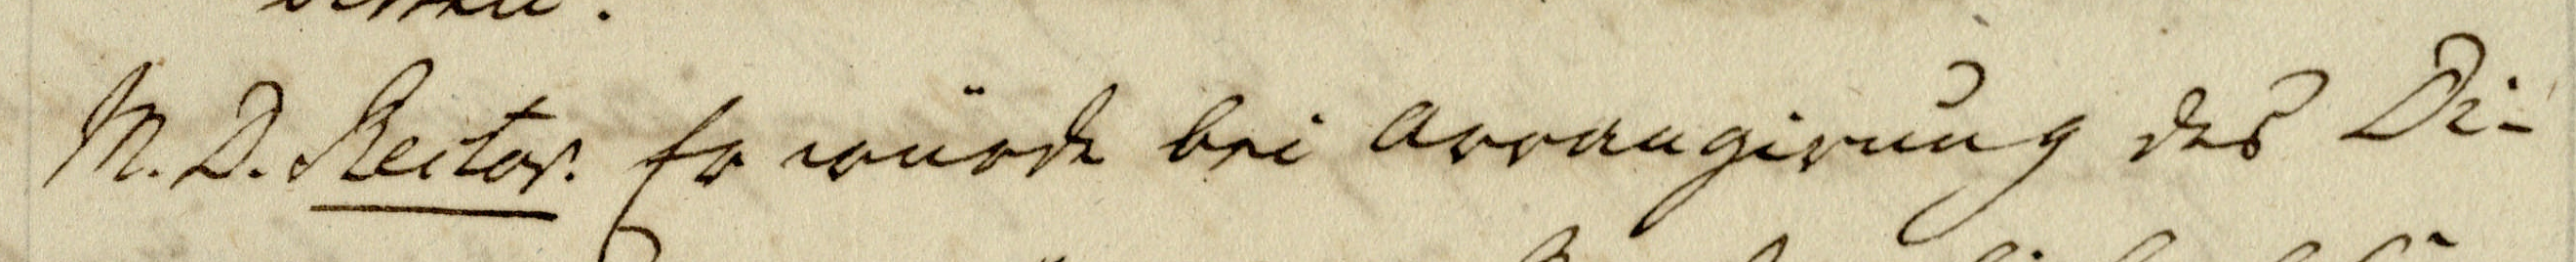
M. D. Rector. Er würde bei Arrangirung des Di¬
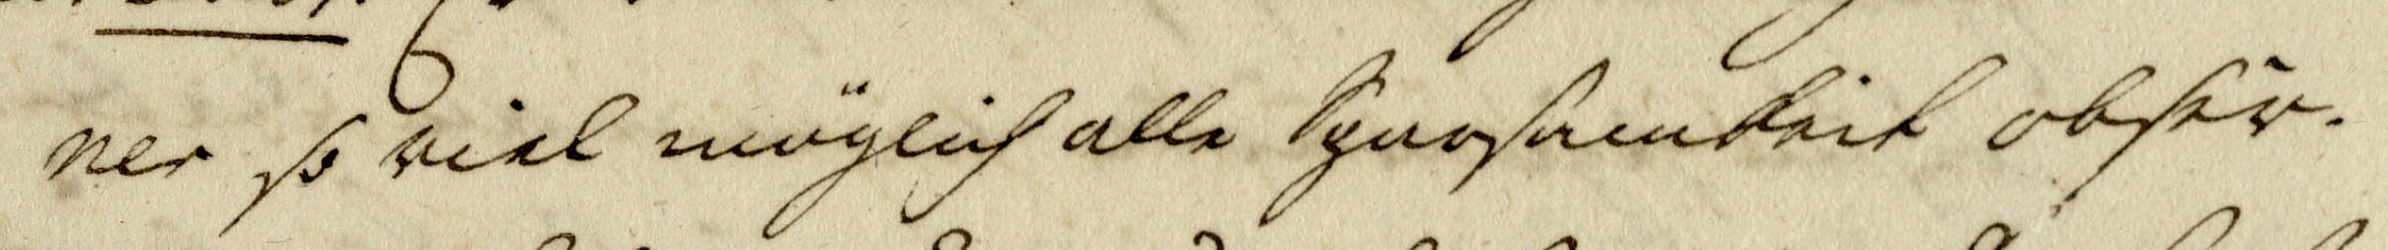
ner so viel möglich alle Sparsamkeit obser¬
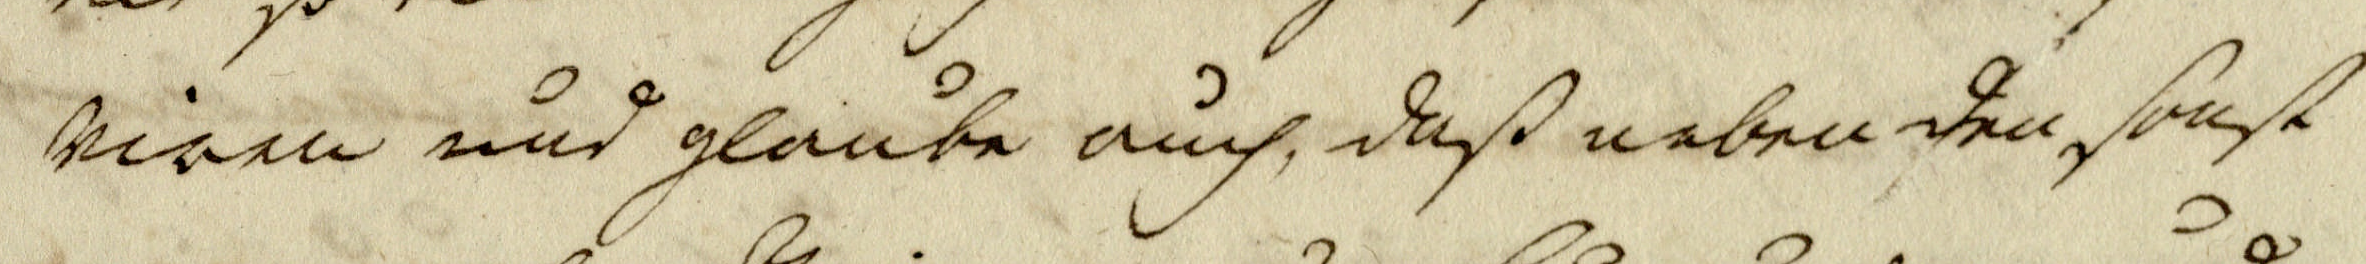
viren und glaube auch, daß neben den sonst
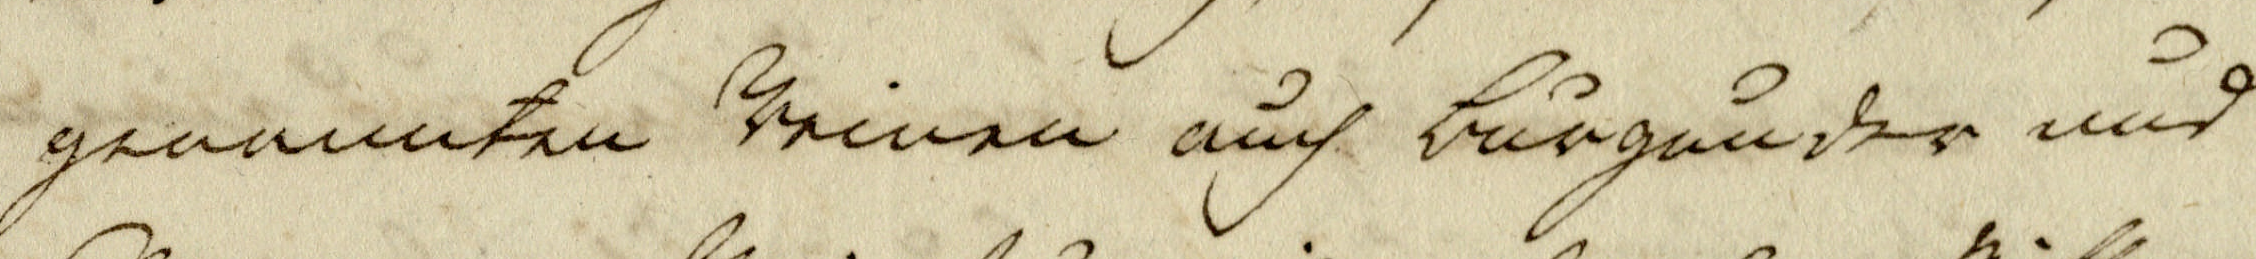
genannten Weinen auch Burgunder und
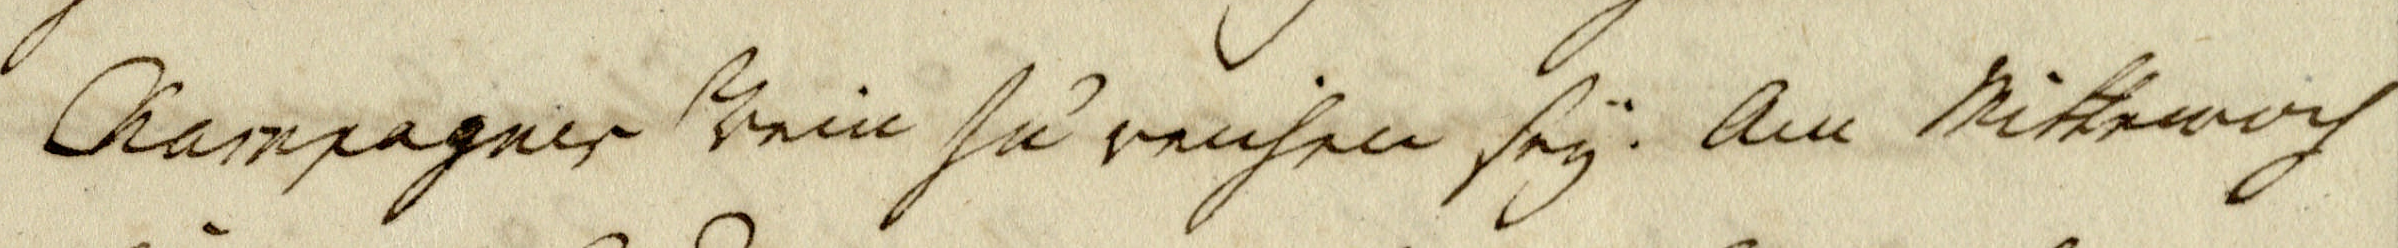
Champagner Wein zu reichen seÿ. Am Mittewoch
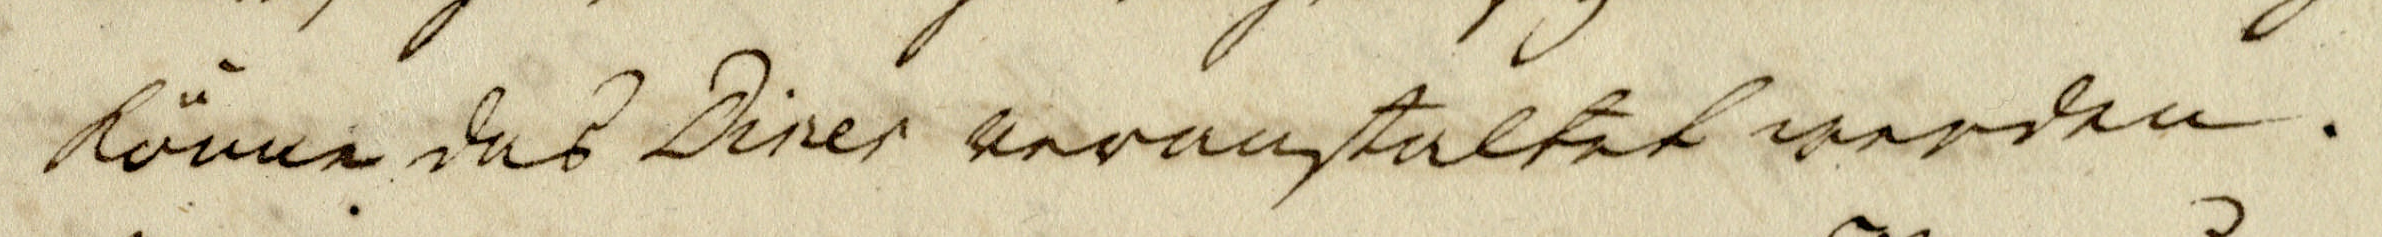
könne das Diner veranstaltet werden.
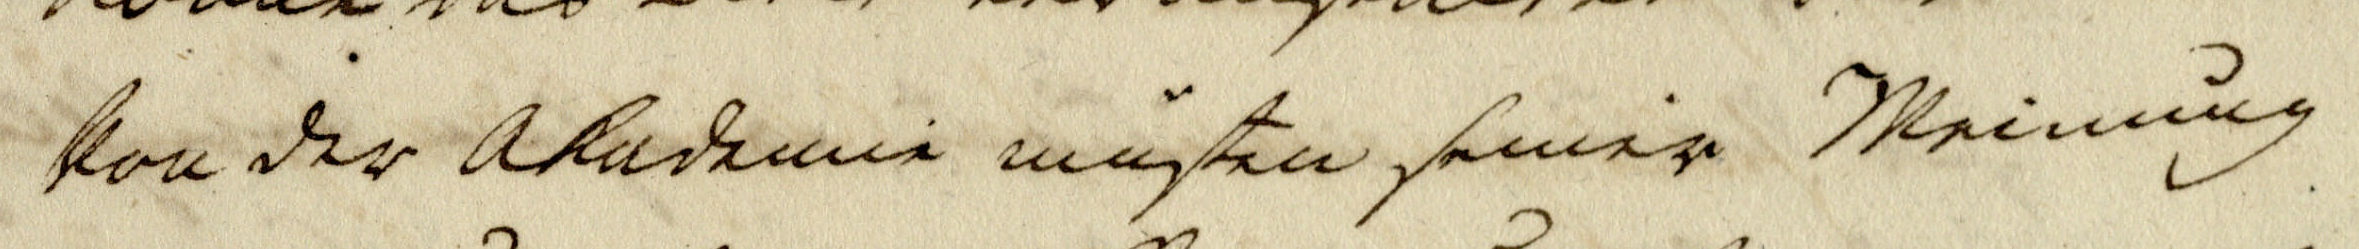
Von der Akademie müssen seiner Meinung
